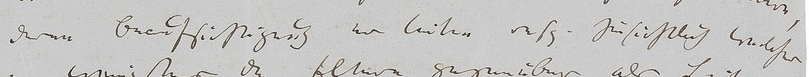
deren Beaufsichtigung er leiten resp. hinsichtlich welcher
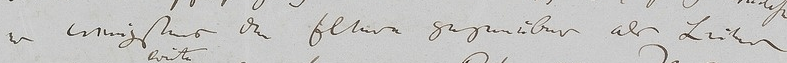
er wenigstens den Eltern gegenüber als Leiter
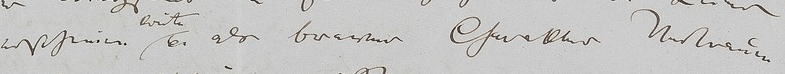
erscheinen könnte &. als braver Charakter Vertrauen
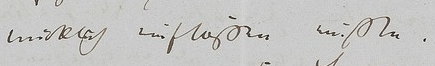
wirklich einflößen müßte.
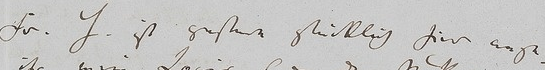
Fr. H. ist gestern glücklich hier ange-
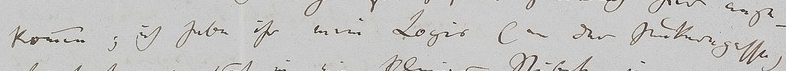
kommen; ich habe ihr mein Logis (an der Junkerngasse)
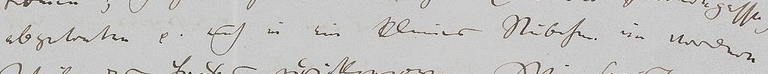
abgetreten &. mich in ein kleines Stübchen im vordern
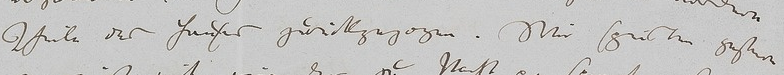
Theile des Hauses zurückgezogen. Wir speisten gestern
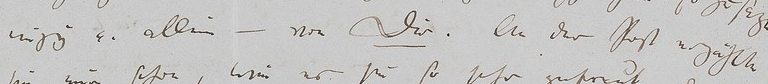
einzig &. allein – von Dir. An der Post erzählte
